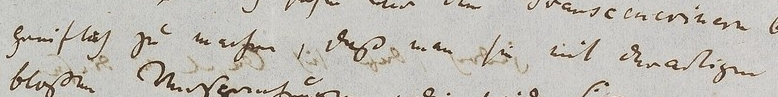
greiflich zu machen, daß man sie mit derartigen
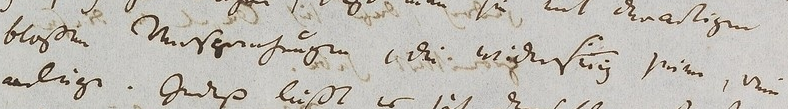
bloßen Versprechungen, die widersinnig seien, rein
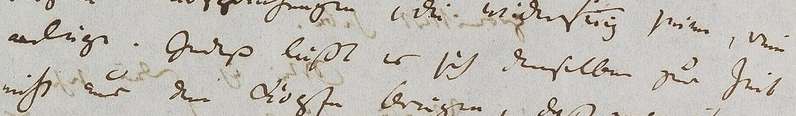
anlüge. Indeß läßt es sich denselben zur Zeit
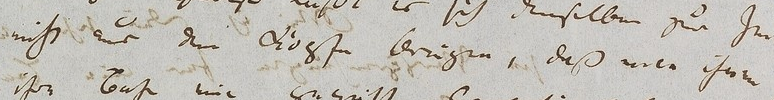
nicht aus dem Kopfe bringen, daß man ihnen
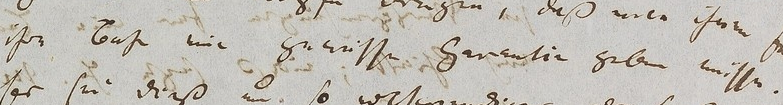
ihre Bahn eine gewisse Garantie geben müsse.
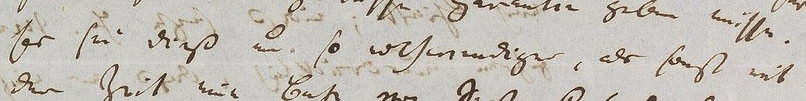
Es sei dieß um so nothwendiger, als sonst mit
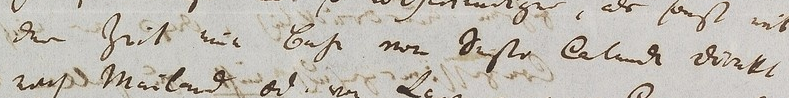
der Zeit eine Bahn von Sesto Calende direkt
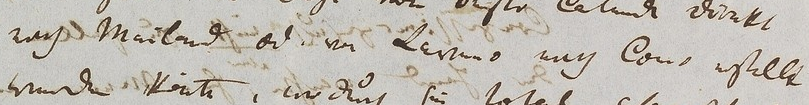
nach Mailand od. von Laveno nach Como erstellt
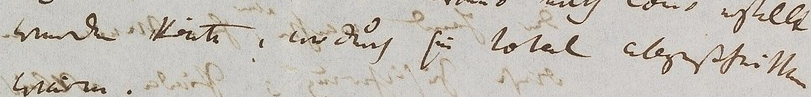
werden könnte, wodurch sie total abgeschnitten
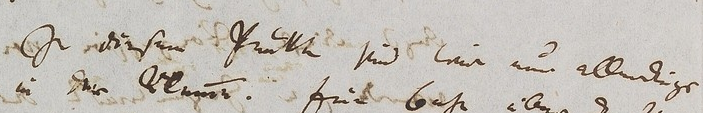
In diesem Punkte sind wir nun allerdings
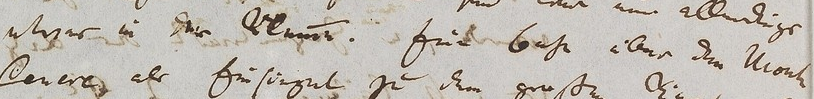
etwas in der Klemme. Eine Bahn über den Monte
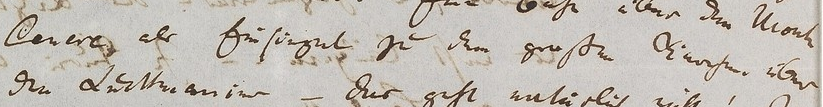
Cenere als Einsiegel zu dem großen Knochen über
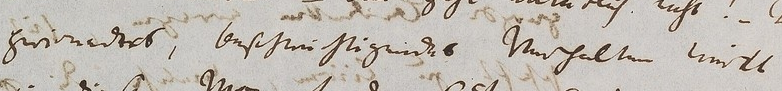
perirendes, beschwichtigendes Verhalten wirkt
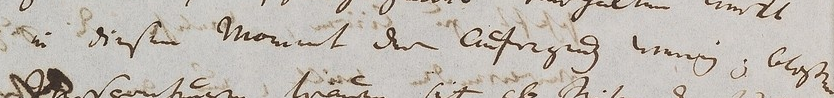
in diesem Moment der Aufregung wenig; bloßen
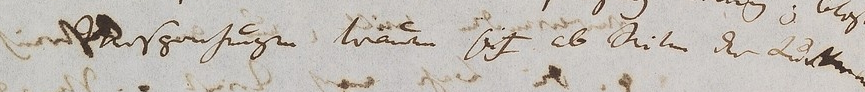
Versprechungen trauen sie ab Seiten der Luckmanier
